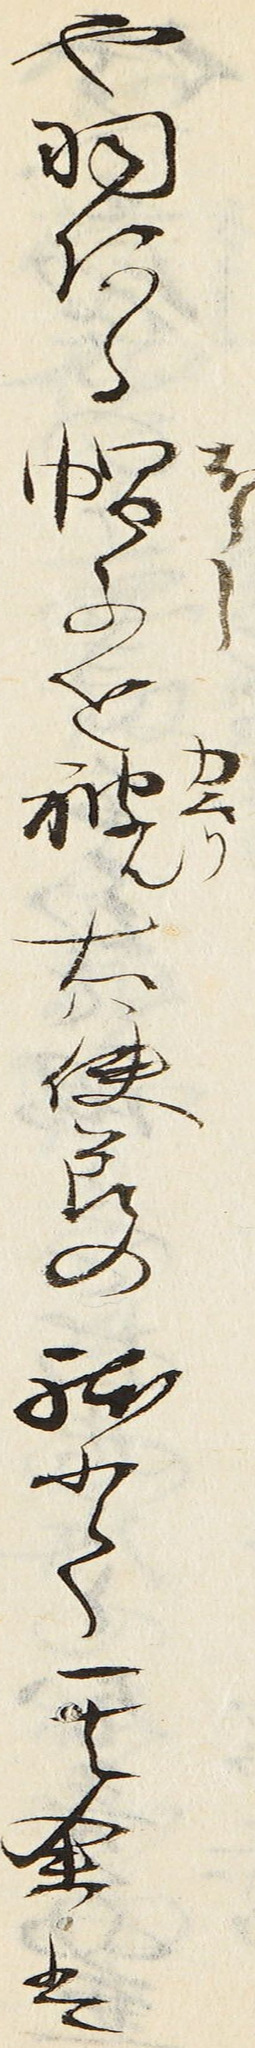や羽ある帽子を被る右は使節の躰にて其余は
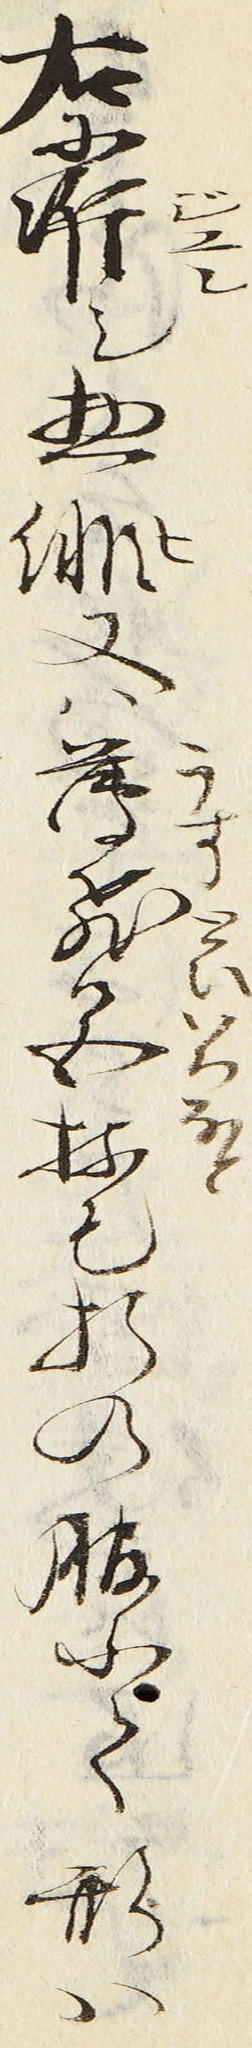右に准し惣緋又は薄飛色抔毛折の服にて形は
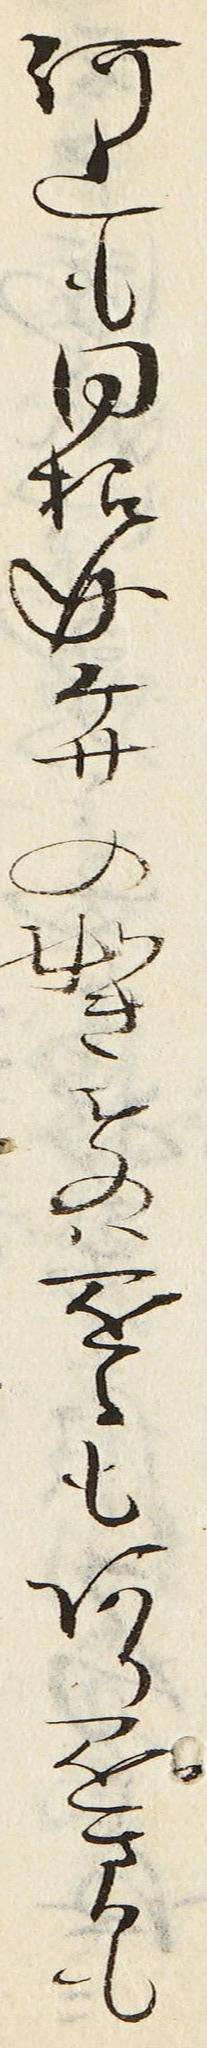何れも同様成ケサの如きものは懸るもあり懸さるも
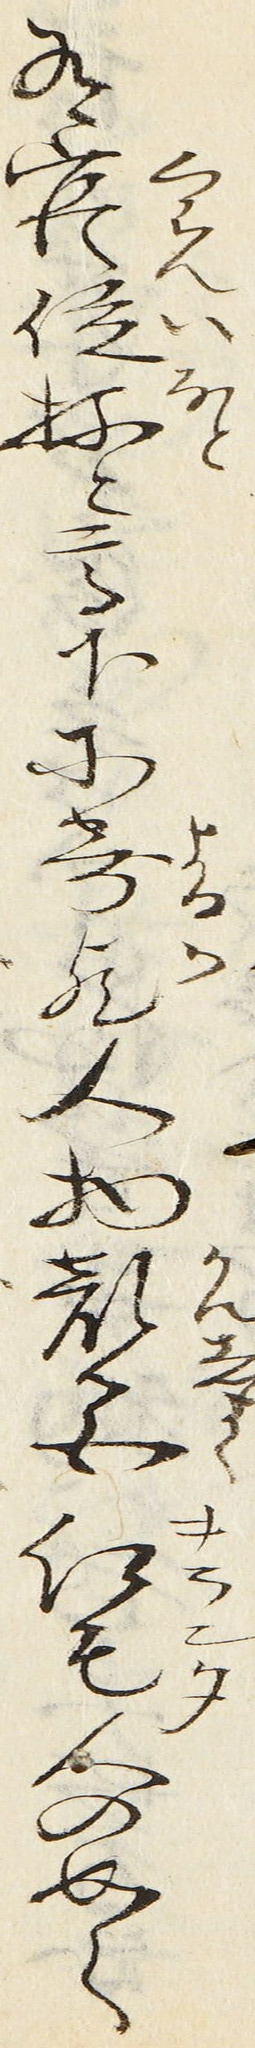有官位抔に高下等寄歟人物顔色紅毛人の如く
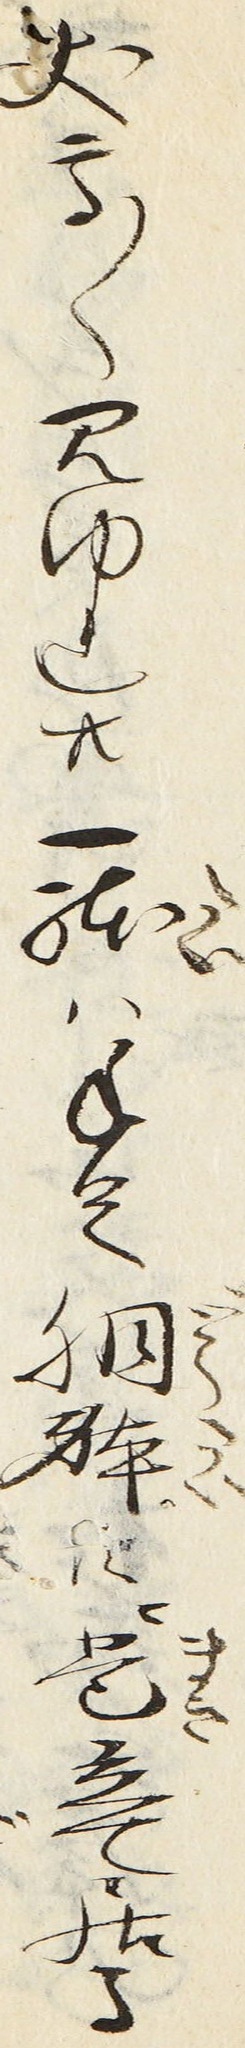丈高く見ゆれ共一躰は手足胴躰共に巻立て居る
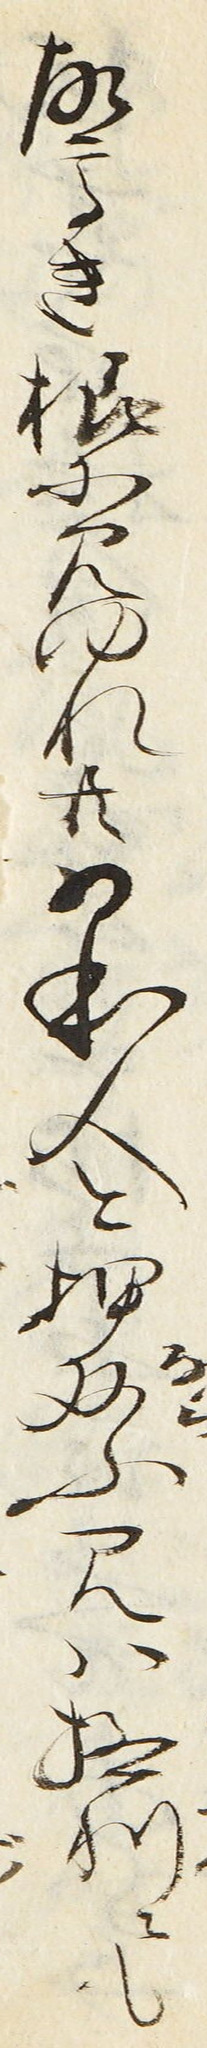故高き様に見みれ共日本人と押双ふ見は格別にも
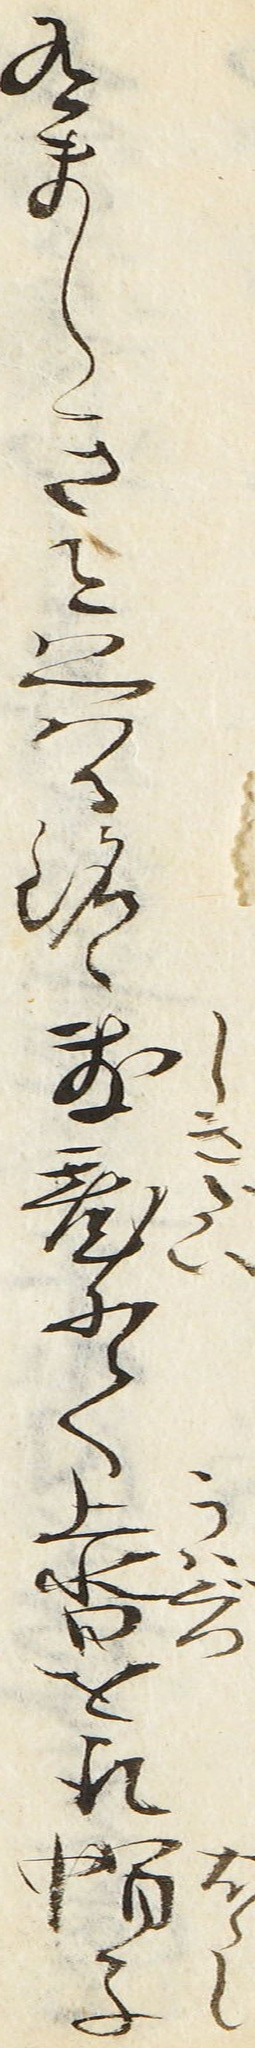有ましきと思はる銘々敷台にて上沓を取帽子
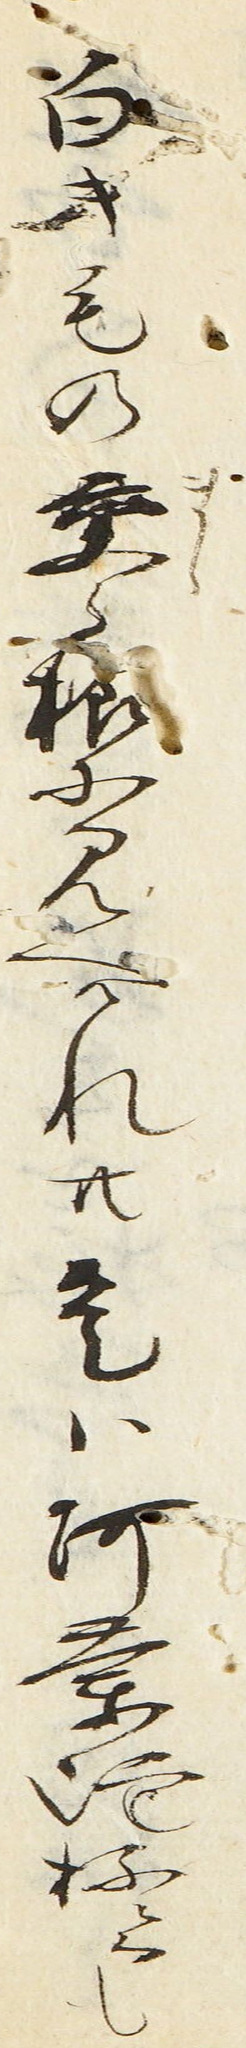白き毛の交る様に見へけれ共色は阿蘭陀様にても

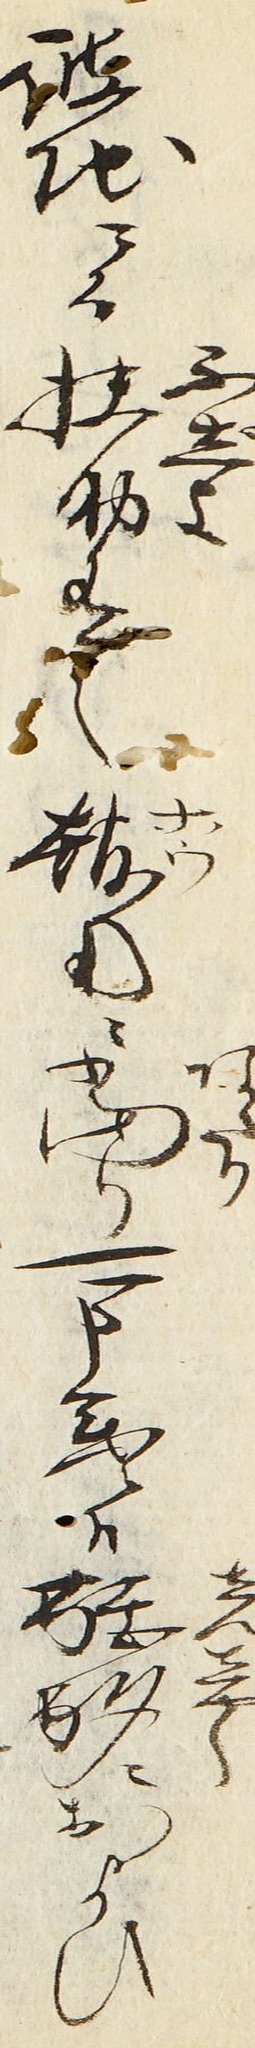彼地にて扶助有之報用に当り可申義に付斟酌におよひ
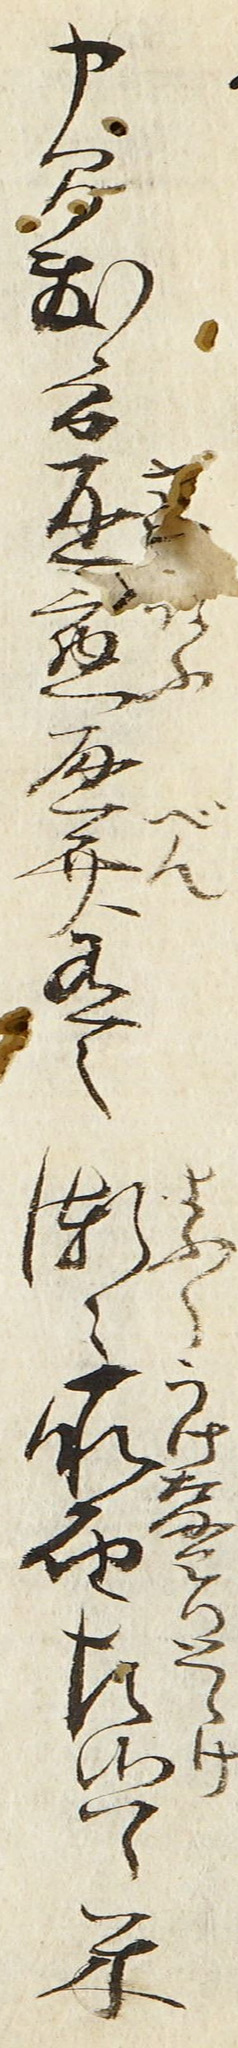申間敷旨再応通弁有之漸々承届乍候て米
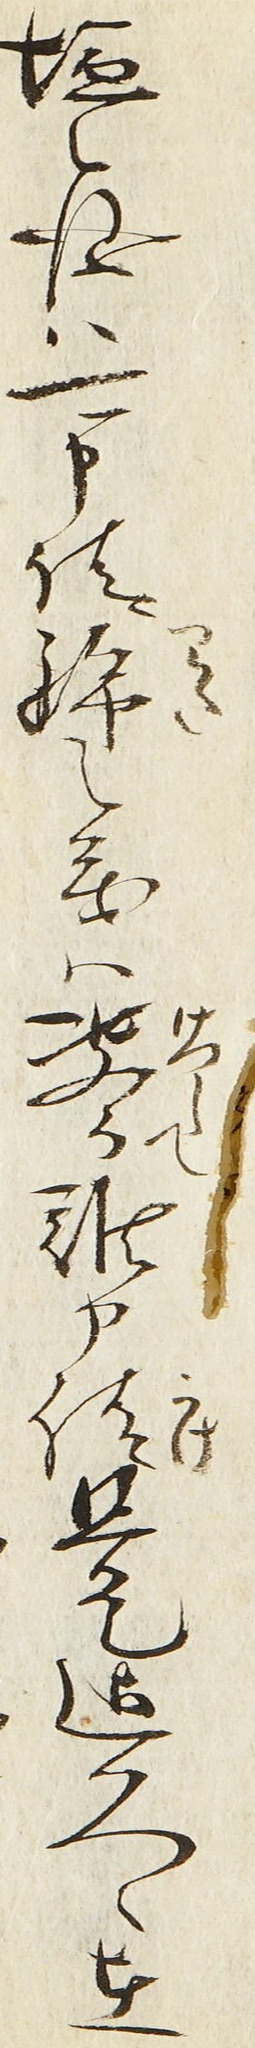塩之儀は可申請綿の義は決て申請且是迄久く在
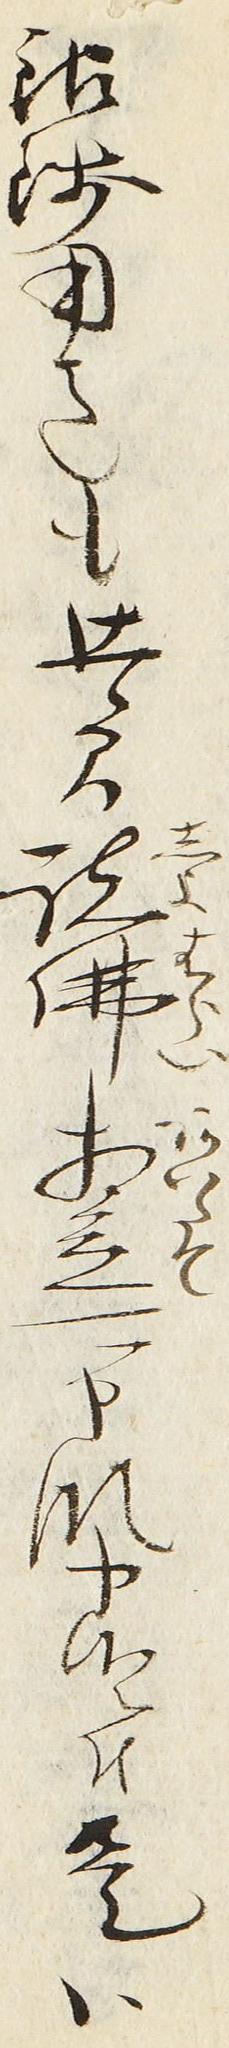銀銭用意も在候間諸払相立可申段申候に付是は
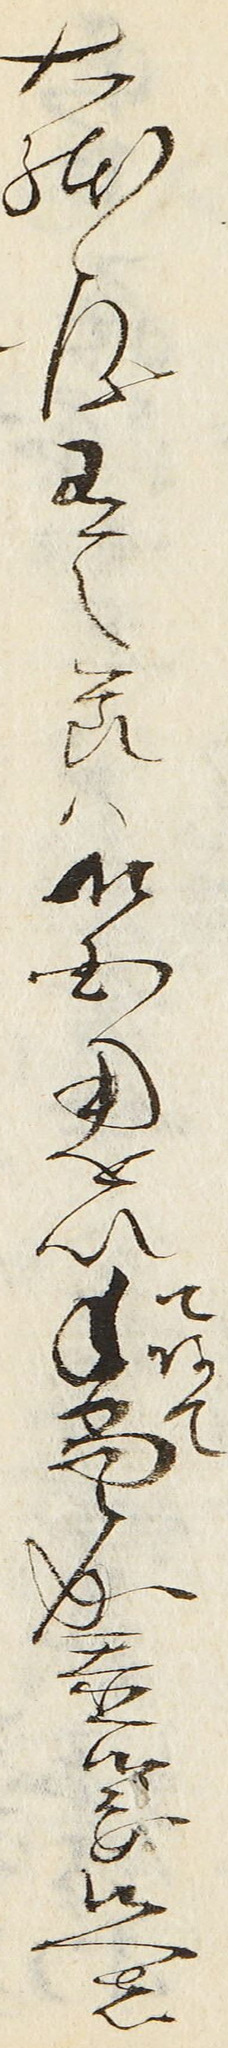右躰之儀有之節は御国用を以手当被成置候義候得は
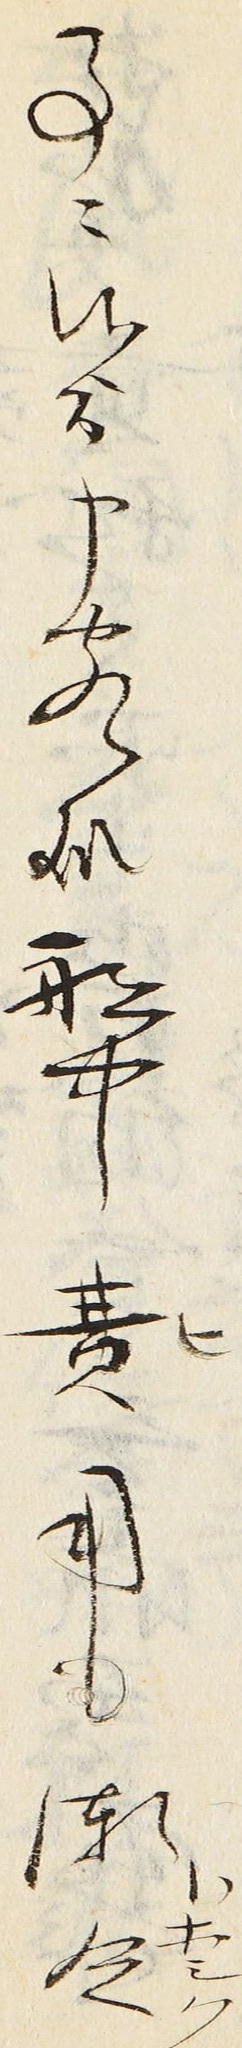事に候旨申聞候処船中費用も漸乏
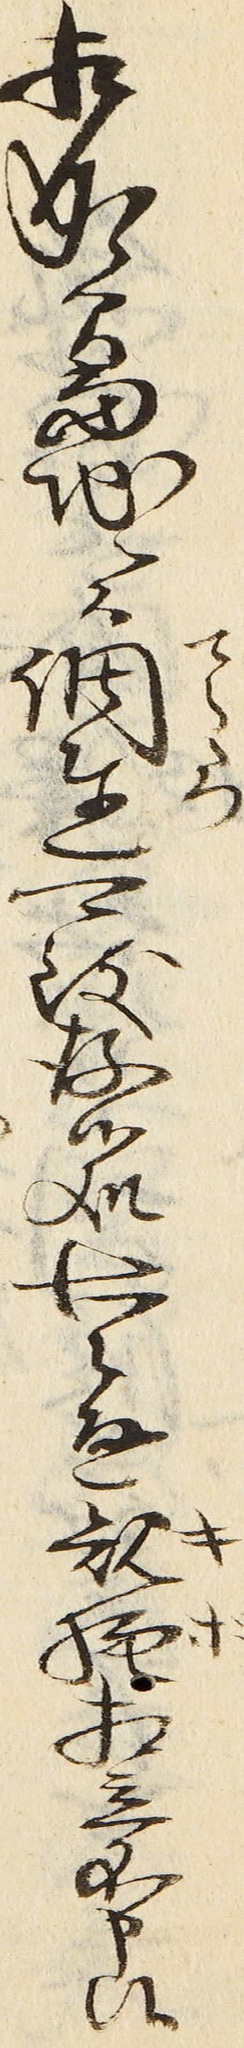相成候間当地にて調達可致存候処右之通規模相立不申候
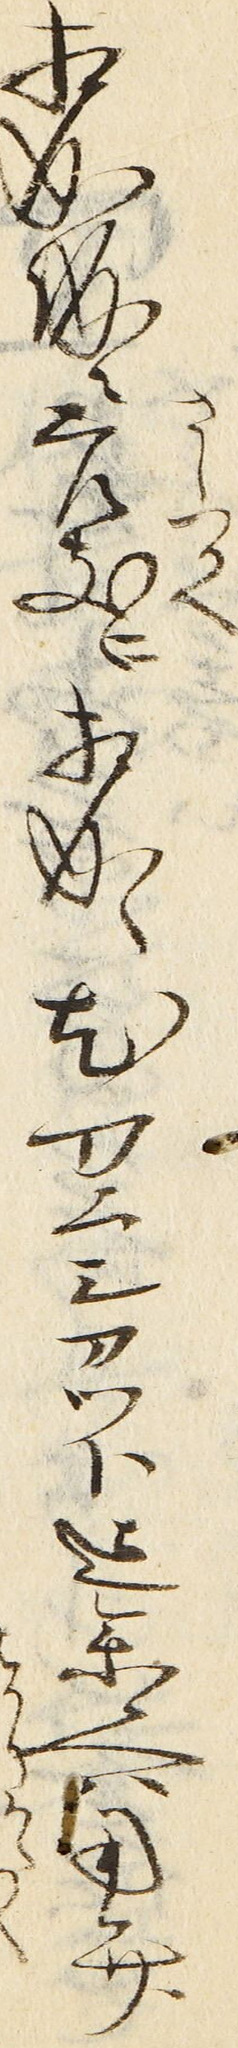相成儀に差支に相成候尤カムシカツト迄参候へは用弁
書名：魯西亜国舟渡来始末并日本流漂人異国遍歴之話（西洋欧羅巴州之内一）
